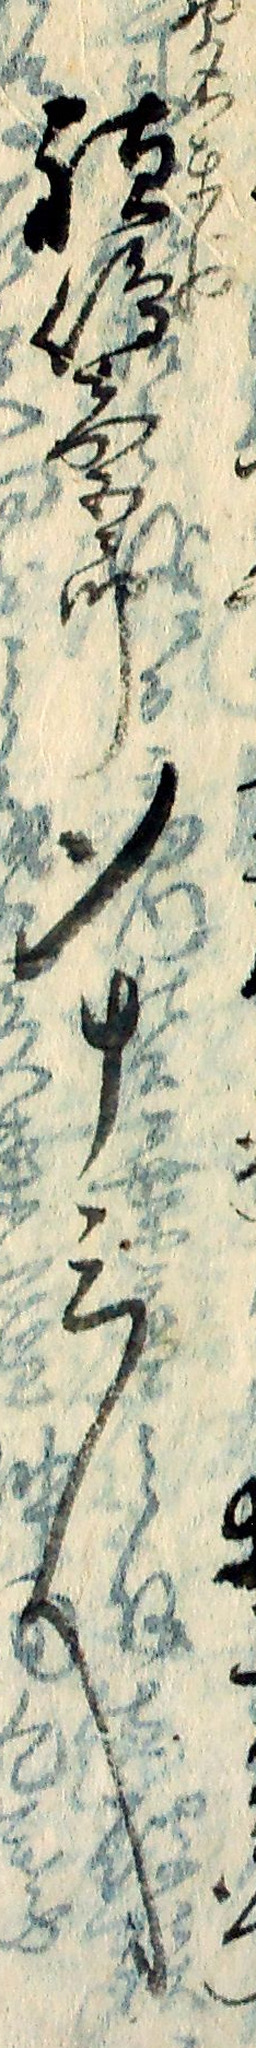禎島嘉五郎〆十三人
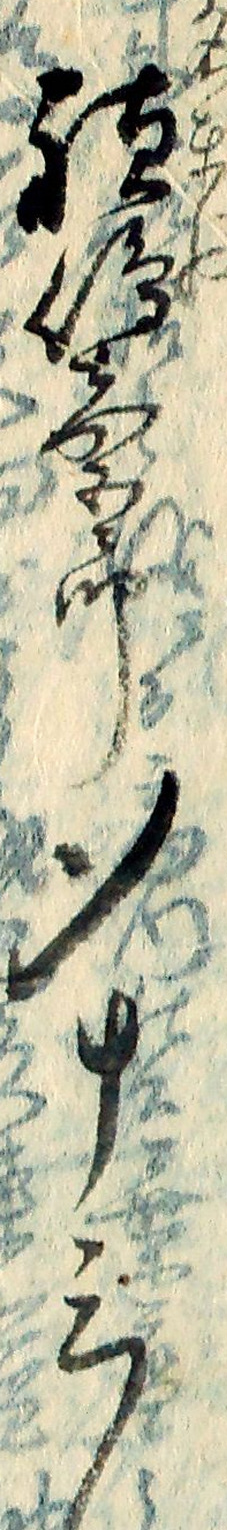禎島嘉五郎〆十三人
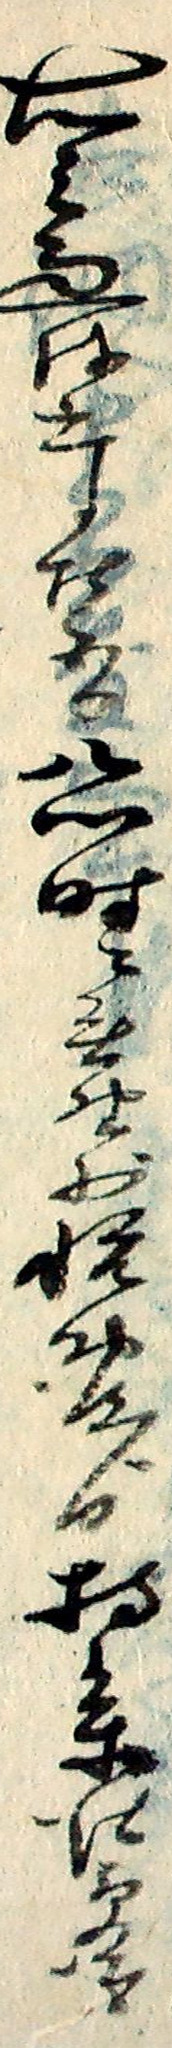右之通戌六月廿五日八ツ時に矢野村悦助殿ゟ持参仕受印
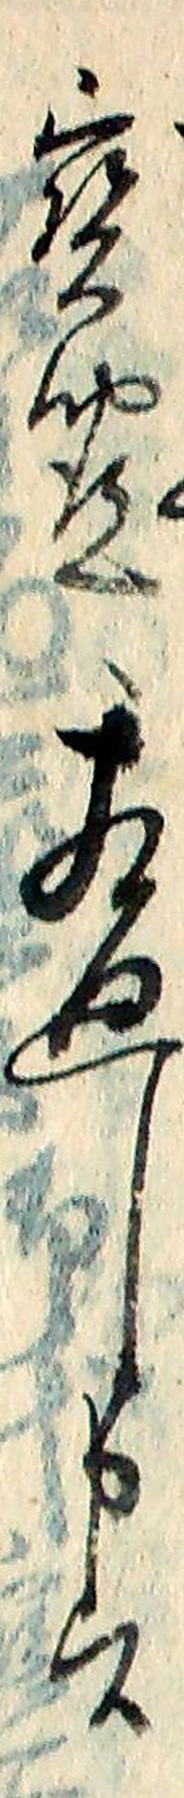宝助殿へ相廻し申候

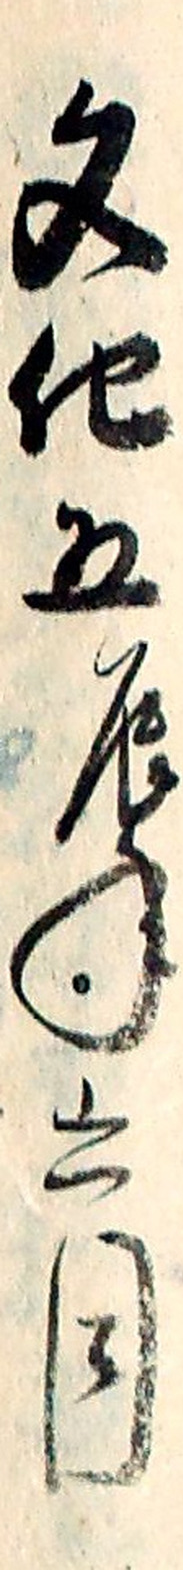文化五辰年六月
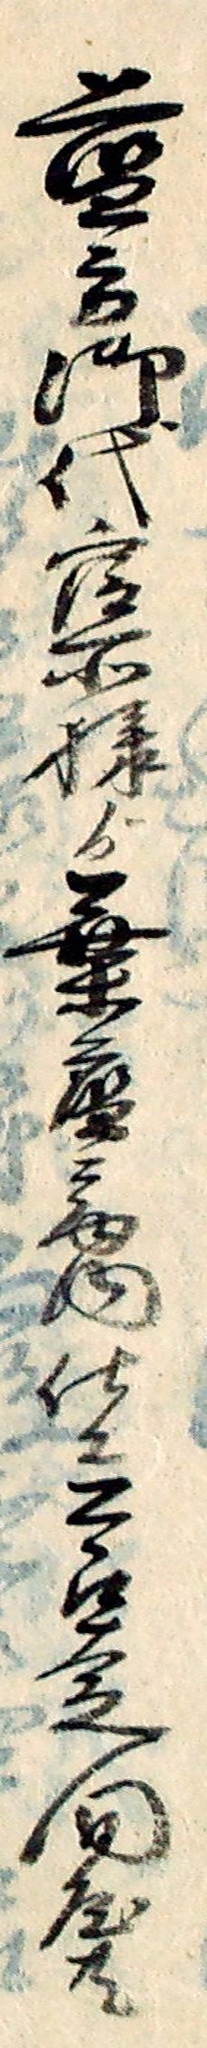藍方御代官所様ゟ葉藍商内仕候節走問屋共
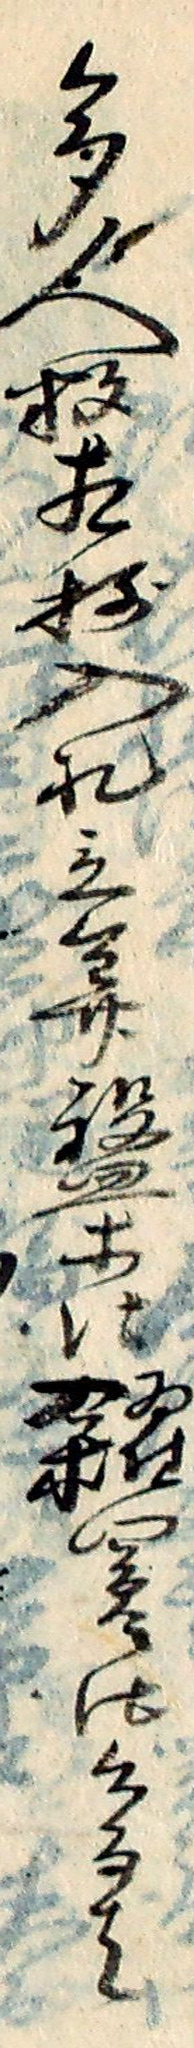多人数相揃入札立算盤等仕糴買仕候ては
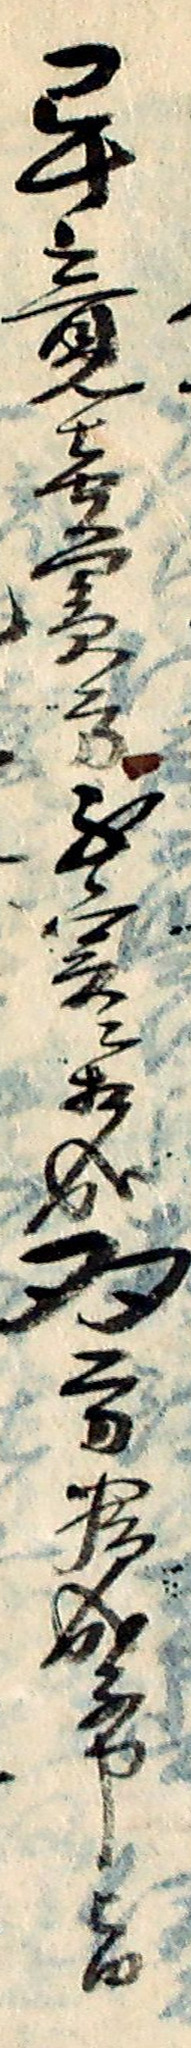畢竟売買方不実に相成双方為成不申旨
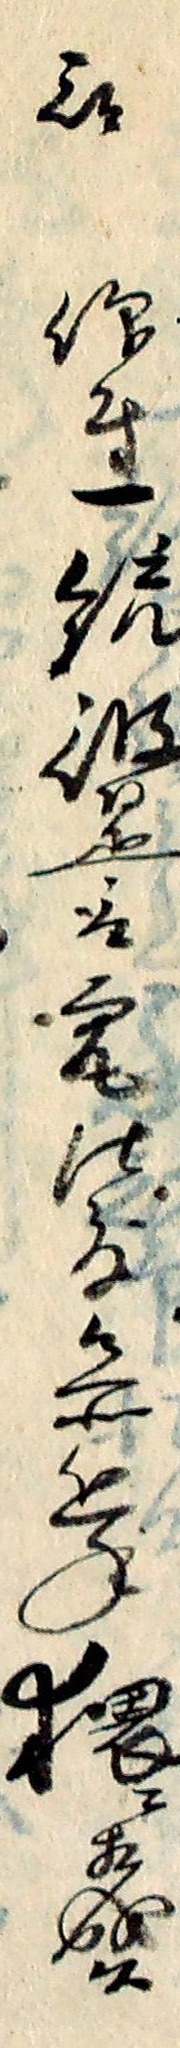被仰付一統彼是取究仕度候所近年猥に相成候
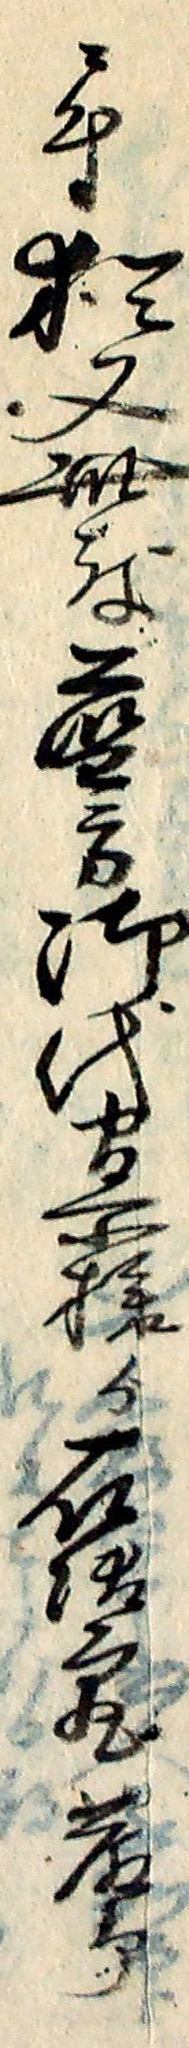に付猶又此度藍方御代官所様ゟ右御究厳布
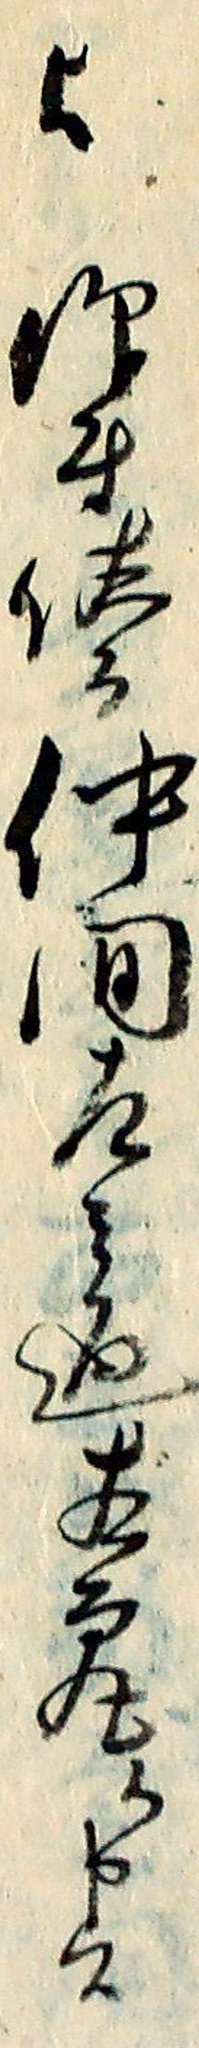被仰付依て仲間左之通相究り申上候
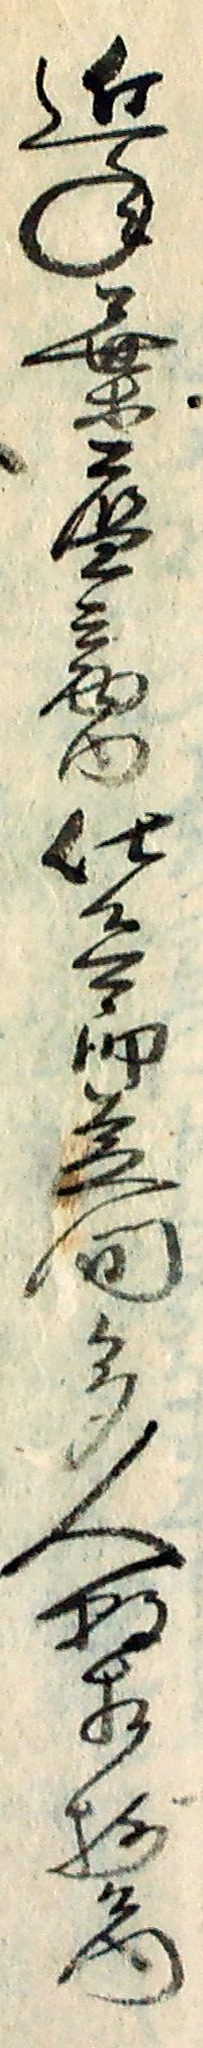近年葉藍商内仕候節走問多人数相揃候内
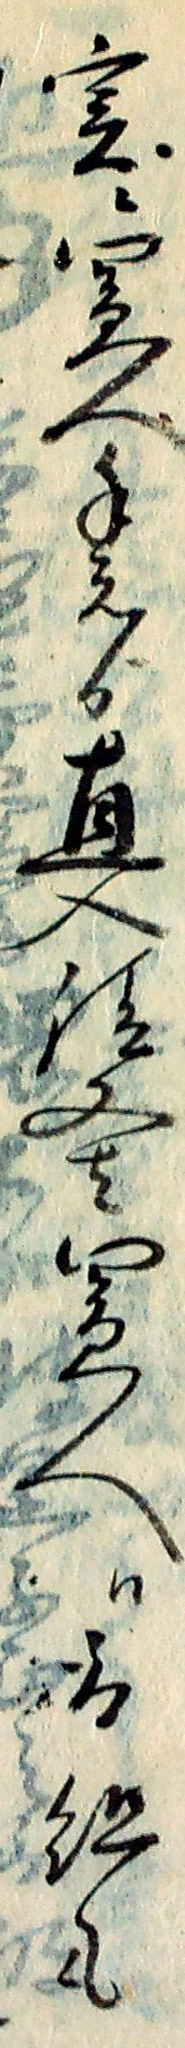実に買人手元ゟ直入請又は買人え取組も
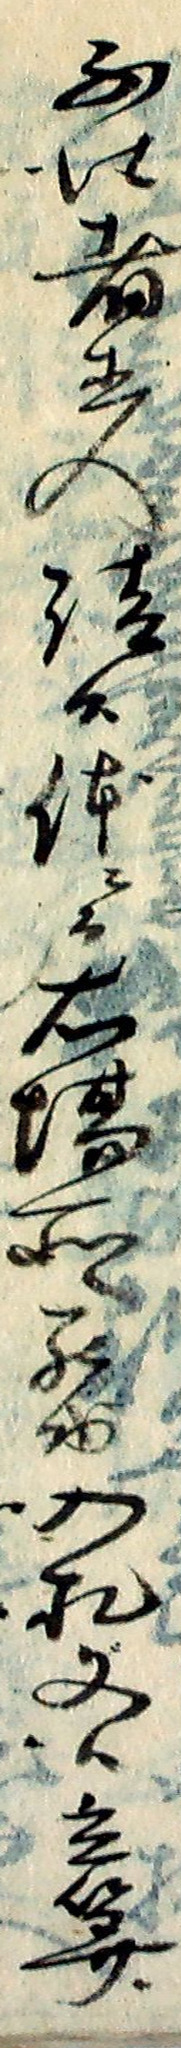不仕者直入請候体にて右場所へ罷出入札又は立算
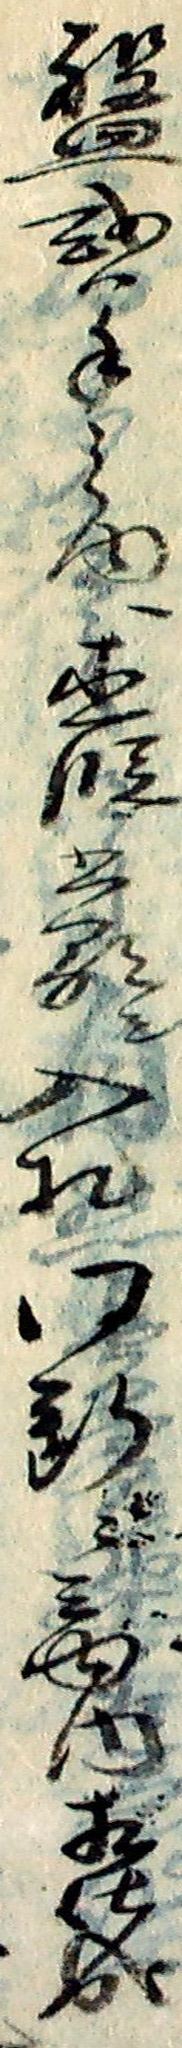盤或は手之内へ直段書顕し入札同断に商内相仕成
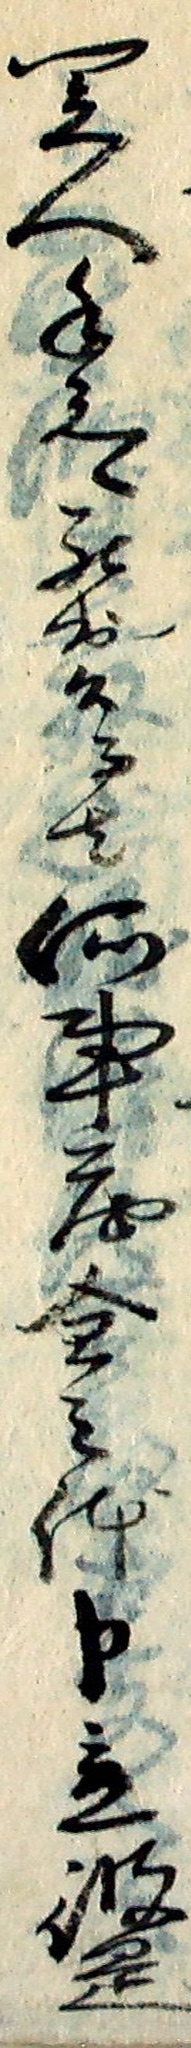買人手元へ罷出候ては何事も全之体申立彼是
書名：諸御願書控(後藤氏壱番）
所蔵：鳴門教育大学 Naruto University of Education
